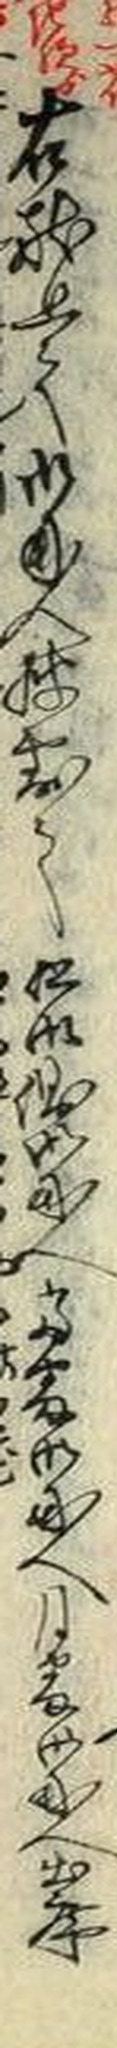右献上之御用人披露之但御側御用人当番御用人月番御用人出席
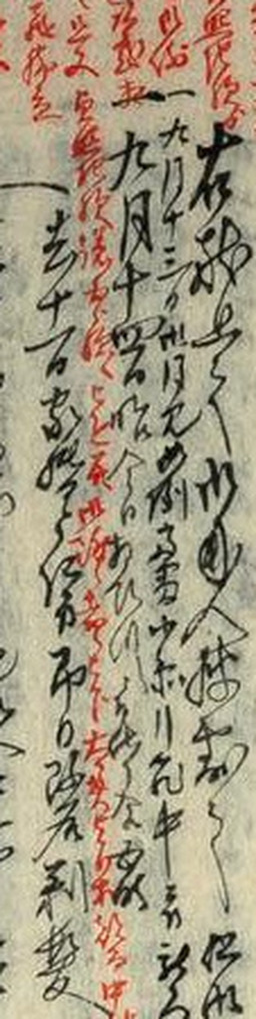一九月十四日昨今日拝領川ニ付代り合五時
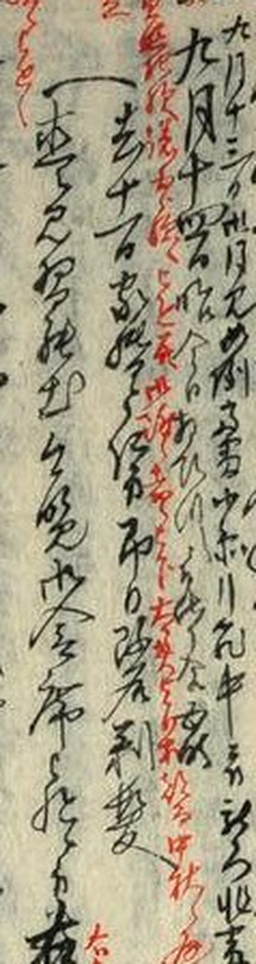去十一日家督被仰付即日改名剃髪
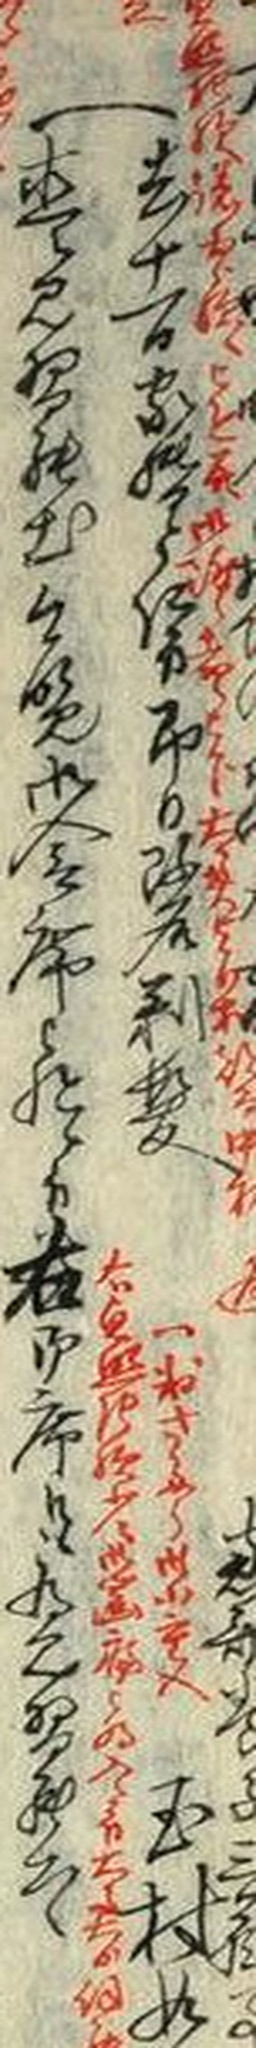直ニ見習罷出今晩御会席被遊候ニ付右御席江も為見習罷出候
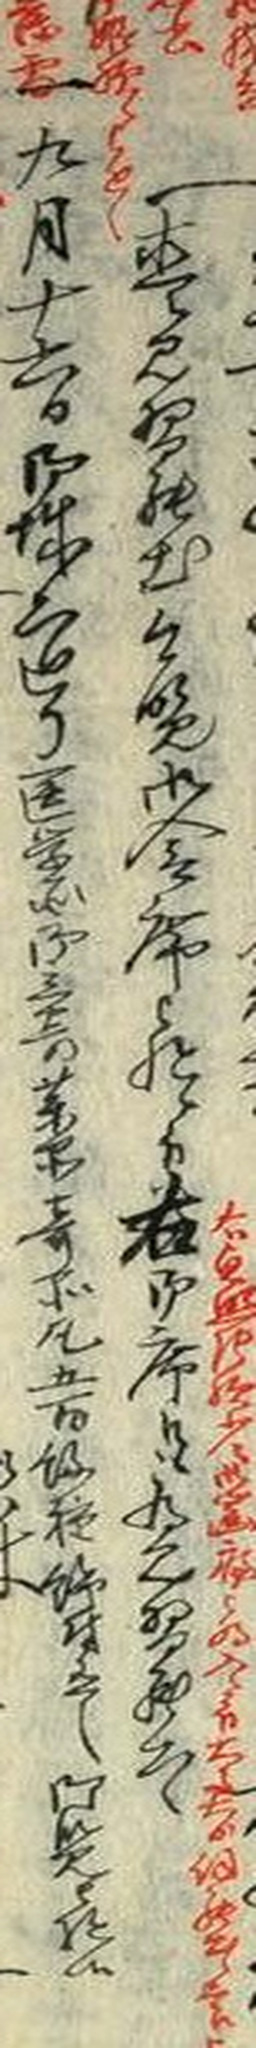一九月十六日御城下廻り医学所御立寄薬品奇品凡五百余種飾付有之御覧被遊候
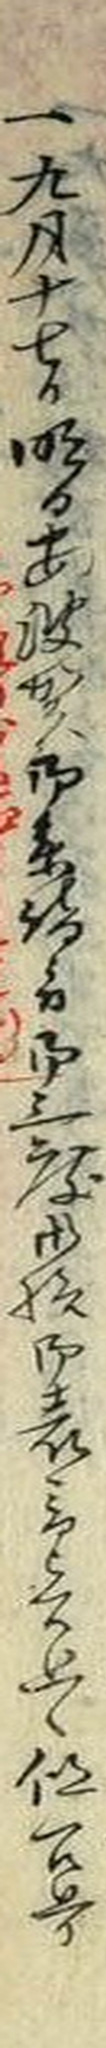一九月十七日明日安波賀御参詣ニ付御三度御膳御表ニ而被召上候但召上り

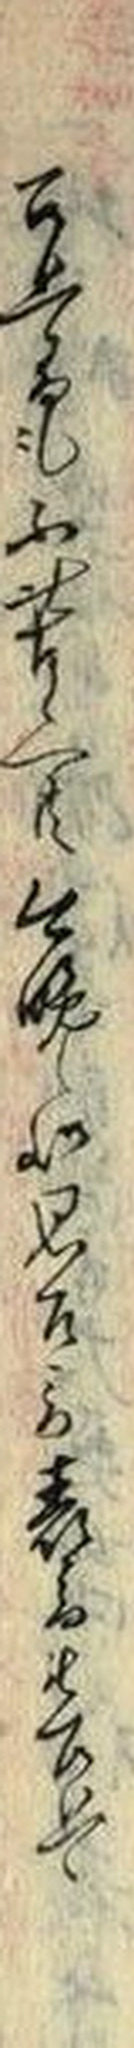召上候而も不苦候へ共今晩之処思召ニ而表ニ而被召上候
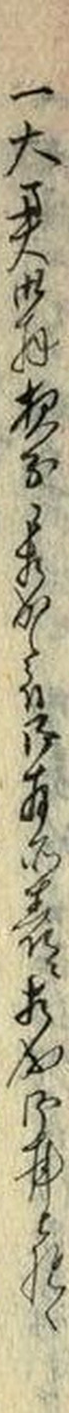一大奥御拝夜分ニ相成候ニ付御拝所表ニ相成御拝被遊候
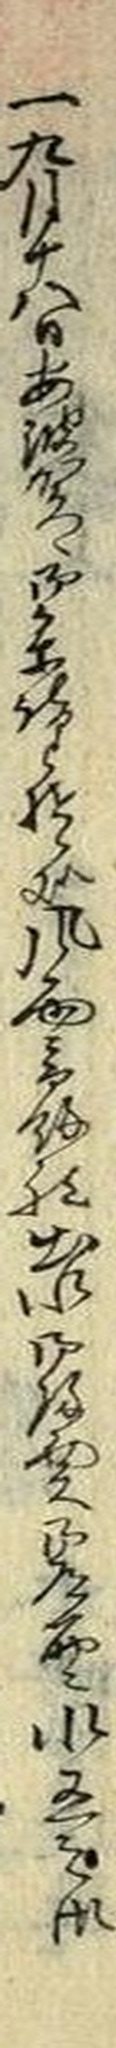一九月十八日安波賀へ御参詣被遊候処風雨ニ而余程出水御帰殿御道筋ニ水有之御
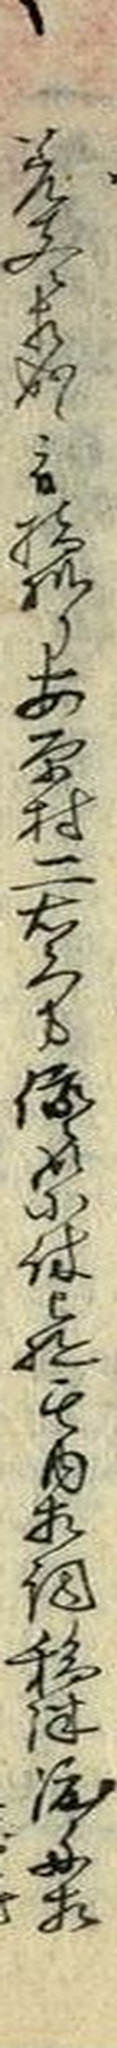差支ニ相成候ニ付指掛り安原村二右衛門方俄ニ御小休被遊其内相調稲津渡舟相
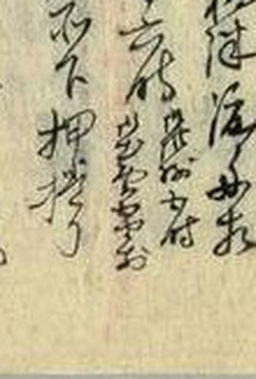御出殿五半時
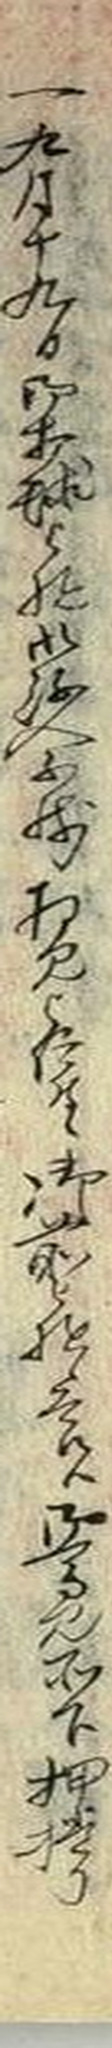一九月十九日御打毬被遊御役人不残拝見被仰付候御前被遊候節ハ御馬見所下押捲り
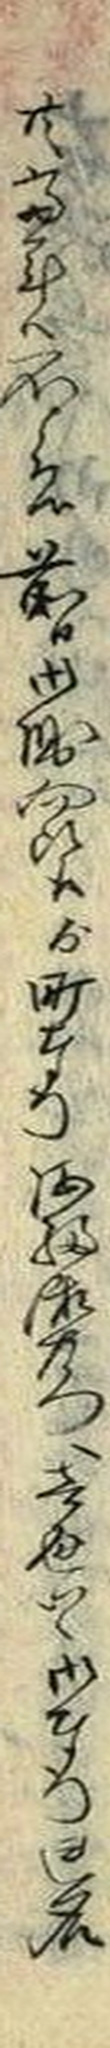共当年ハ不被下候前日御側向頭取ゟ町奉行海福瀬左衛門へ壱通ツヽ御奉行連名
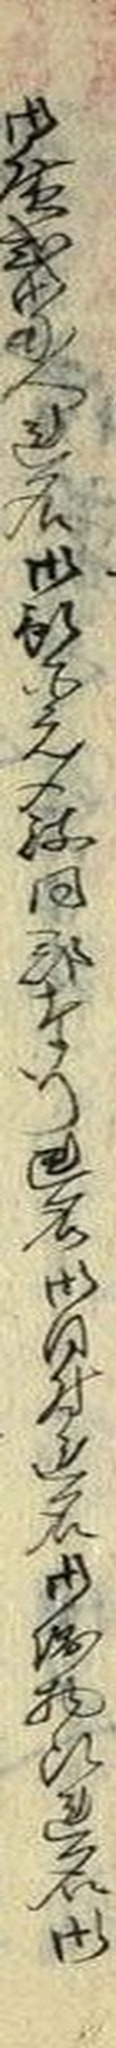御広式御用人連名御預所元〆役同郡奉行連名御目付連名御側物頭連名御
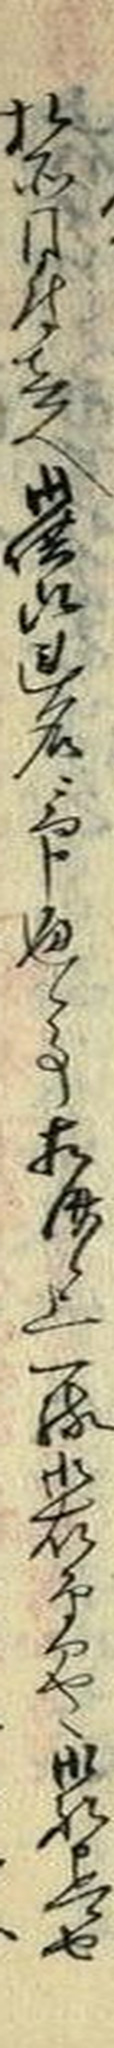札所目付壱人御供頭連名ニ而申通候事相済候上一統御右筆部やへ御礼申上候由
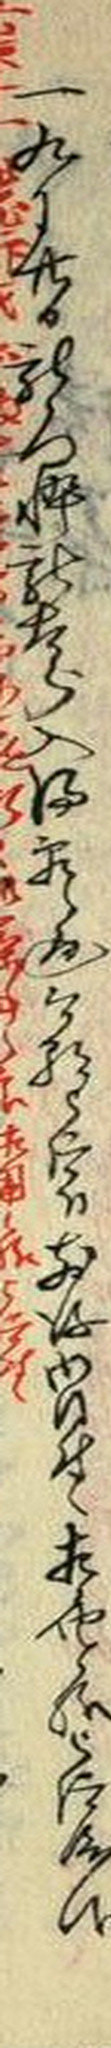一九月廿日新右衛門忰新太郎入湯願之通今朝被仰付前後御目付へ相届候様被仰渡候
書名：少傅日録抄（斉承付側向頭取日記、在国）
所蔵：福井県文書館 Fukui Prefectural Archives
